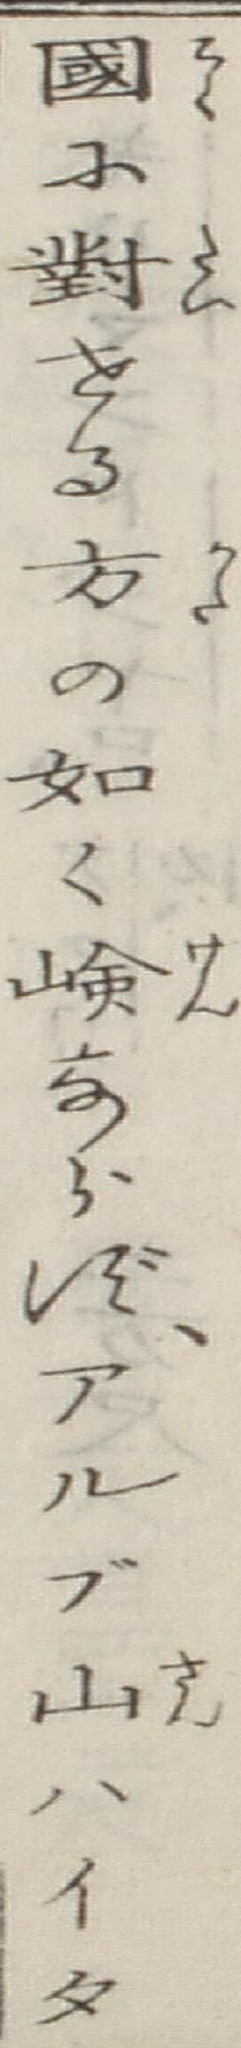国に対せる方の如く嶮ならず，アルブ山はイタ
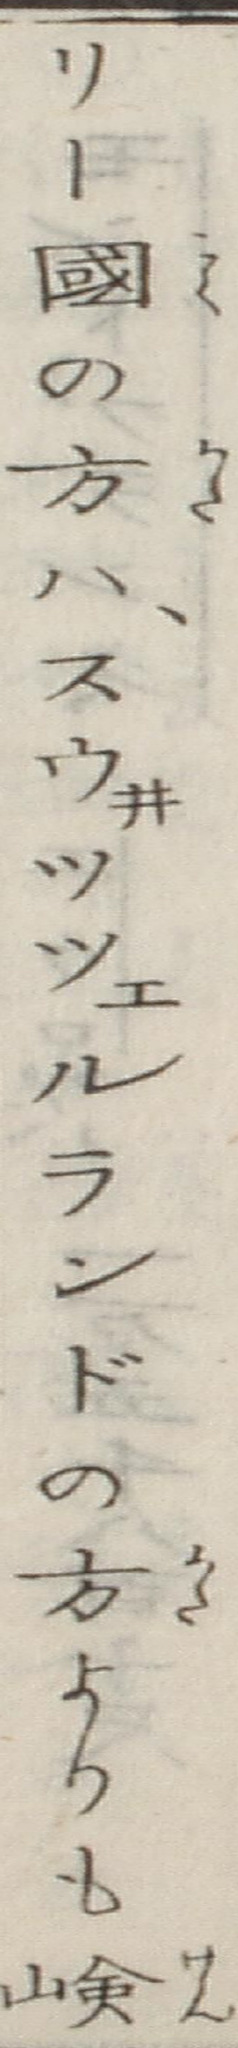リー国の方は、スウィツツェルランドの方よりも嶮
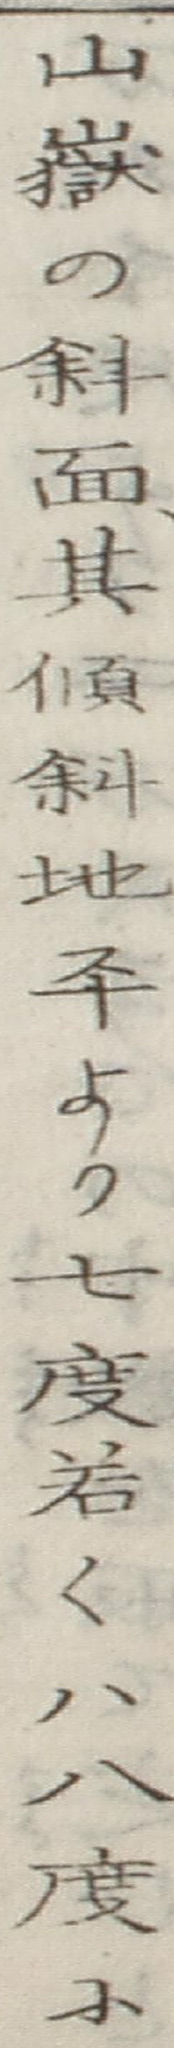山嶽の斜面、其傾斜地平より七度若くは八度に
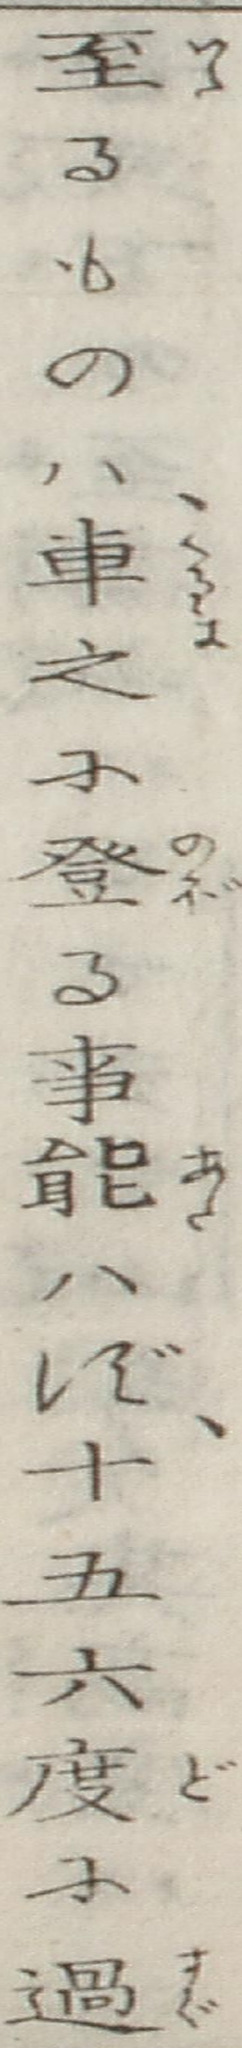至るものは、車之に登る事能はず、十五六度に過
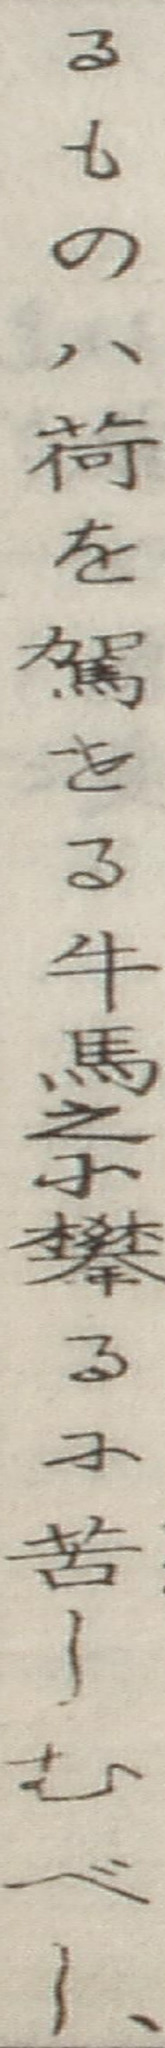るものは、荷を駕せる牛馬之に攀るに苦しむべし、

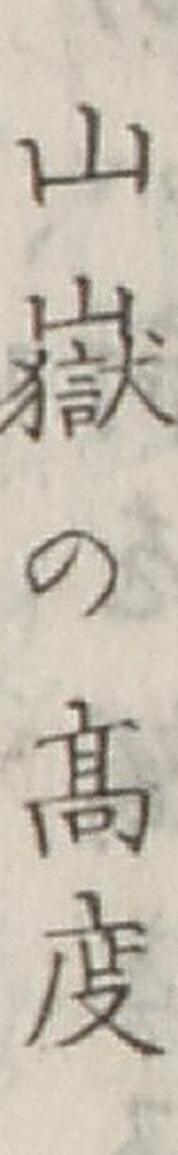山岳の高度
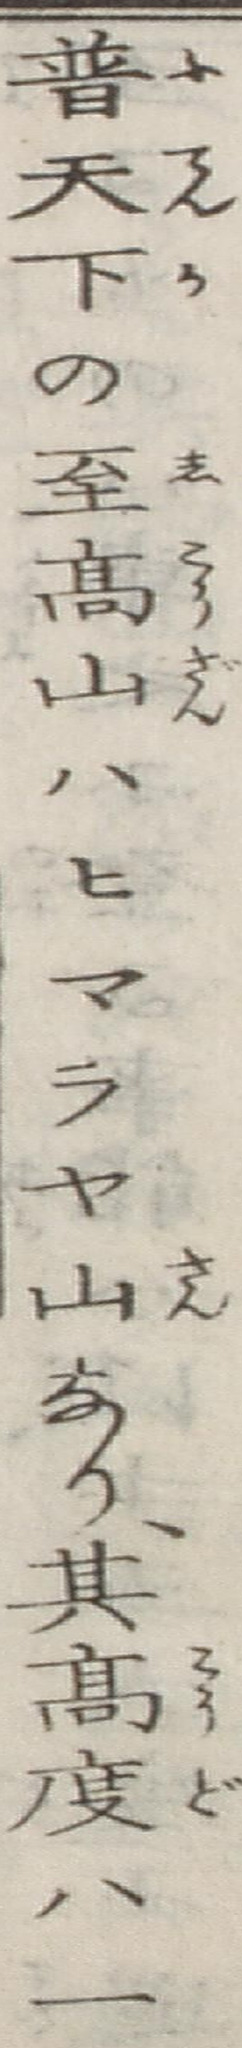普天下の至高山はヒマラヤ山なり、其高度は一
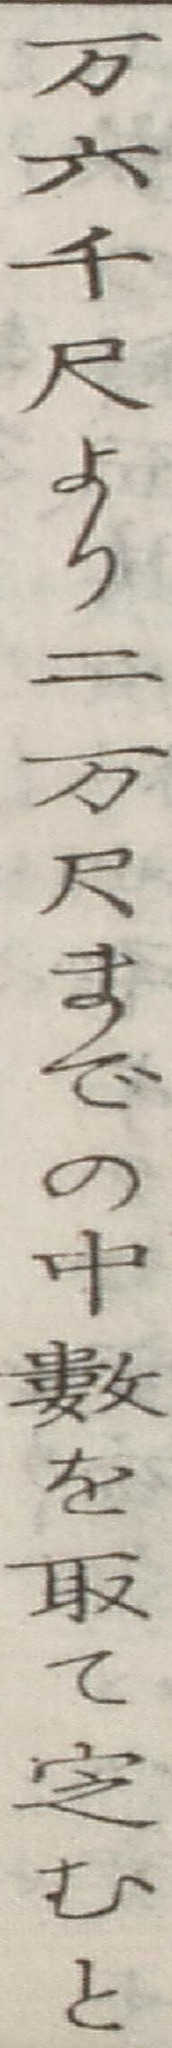万六千尺より二万尺までの中数を取て定むと
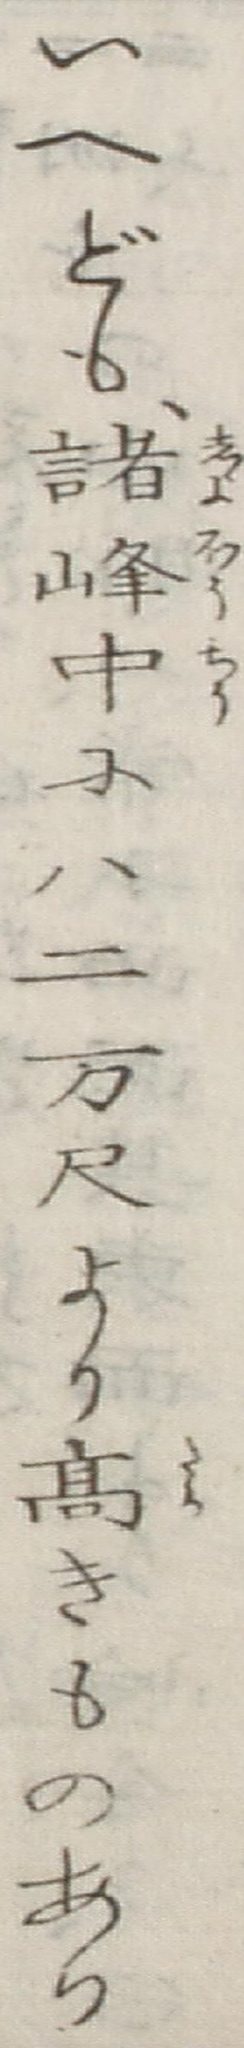いへども、諸峰中には二万尺より高きものあり
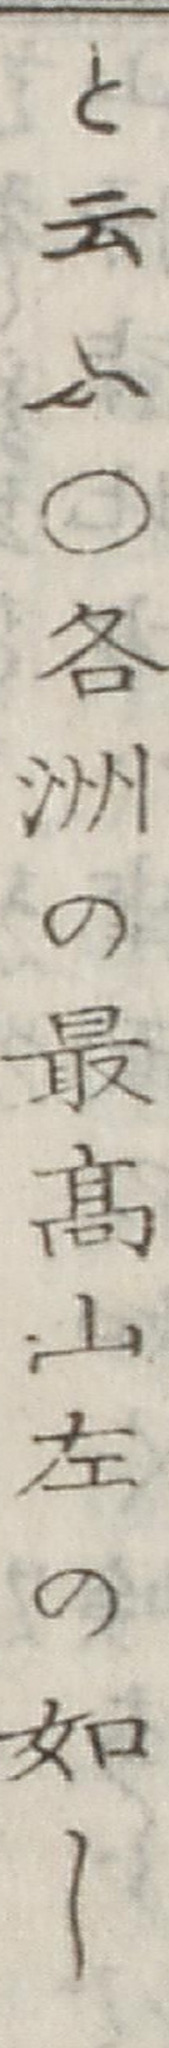と云ふ、〇各洲の最高山左の如し
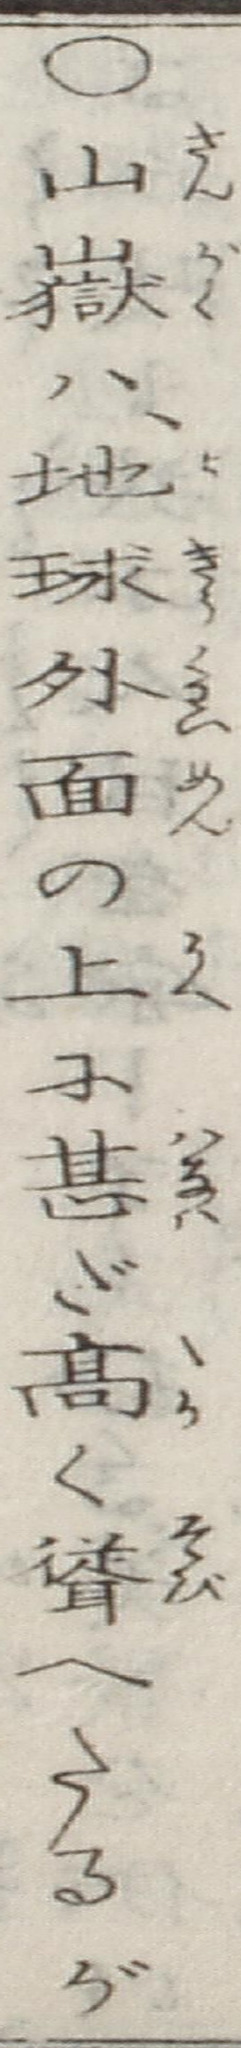〇山岳は、地球外面の上に甚だ髙く聳へたるが
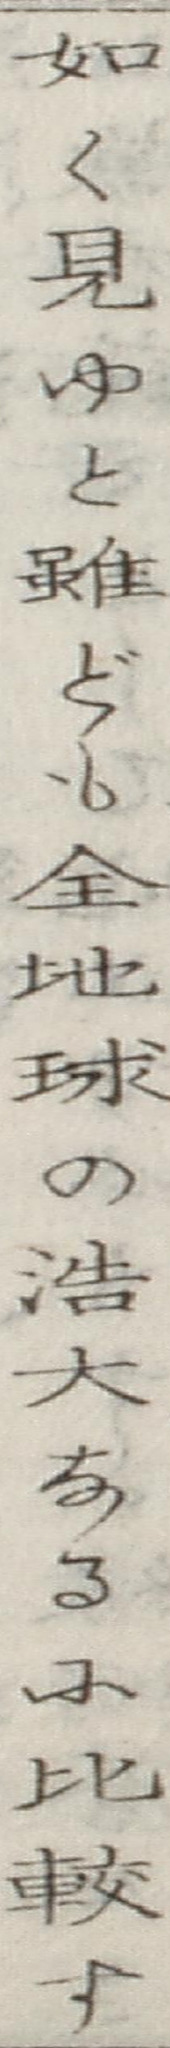如く見ゆと雖ども、全地球の浩大なるに比較す
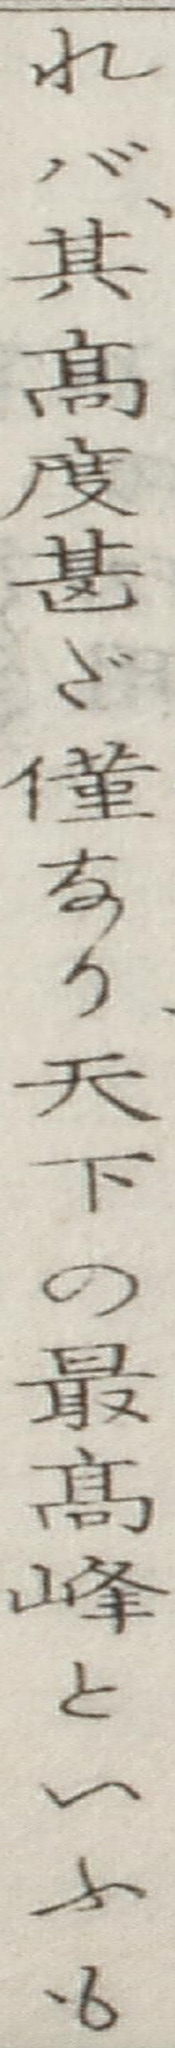れば、其高度甚だ僅なり、天下の最高峰といふも
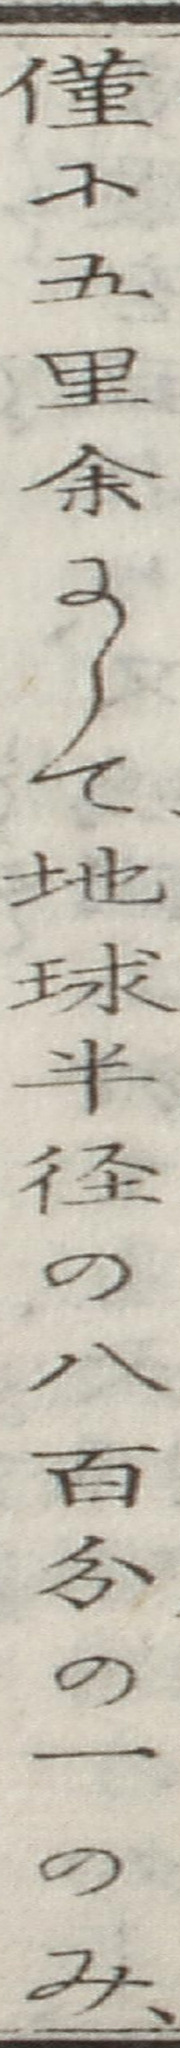僅に五里余にして、地球半径の八百分の一のみ、
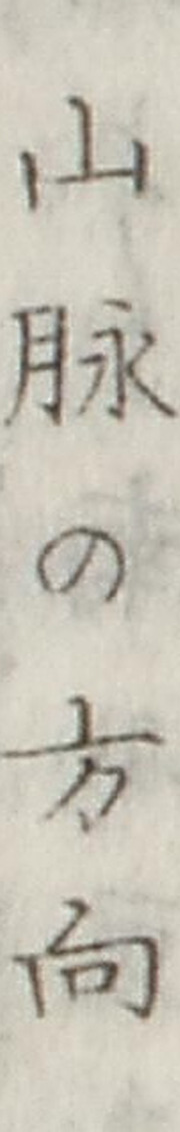山脈の方向
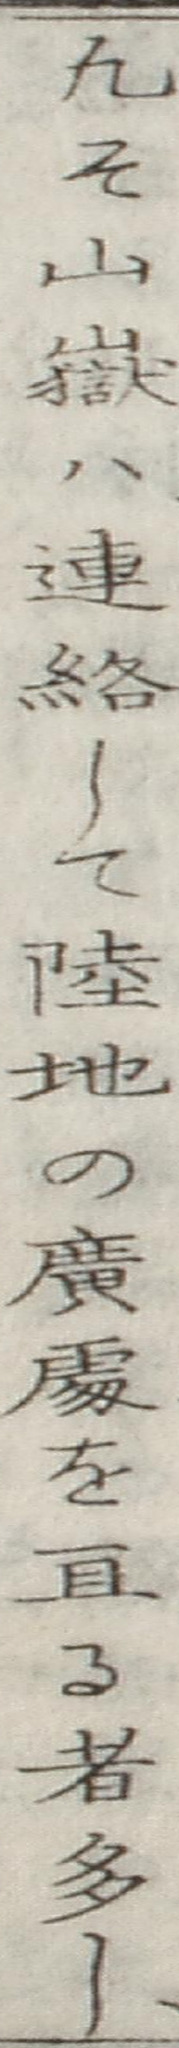凡そ山岳は、連絡して、陸地の廣処を亘る者多し、
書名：訓蒙　天然地理學　上
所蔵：東京大学地震研究所図書室 Earthquake Research Institute Library, The University of Tokyo, JAPAN
